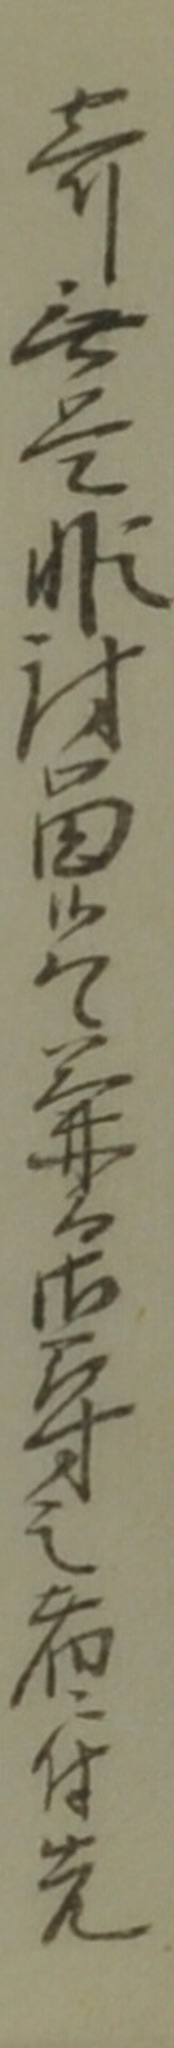寄無是非討留候ハヽ兼而御尋之者ニ付先
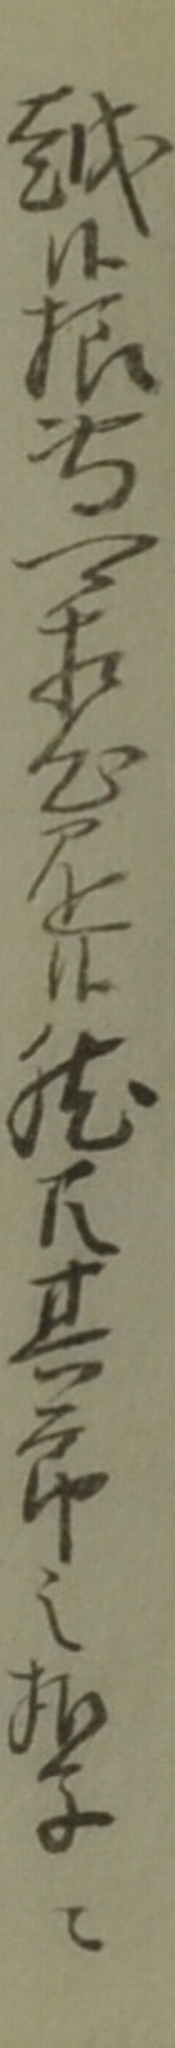越候様専可相心懸候然共其節之様子ニ
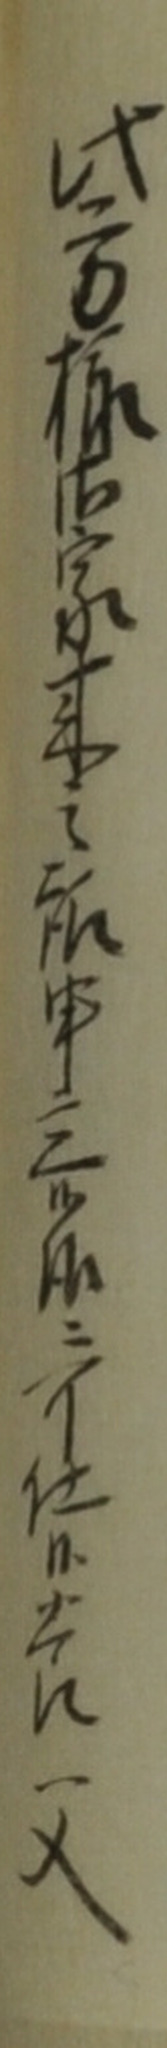此方様御家来之趣申立候様ニ可仕候養父
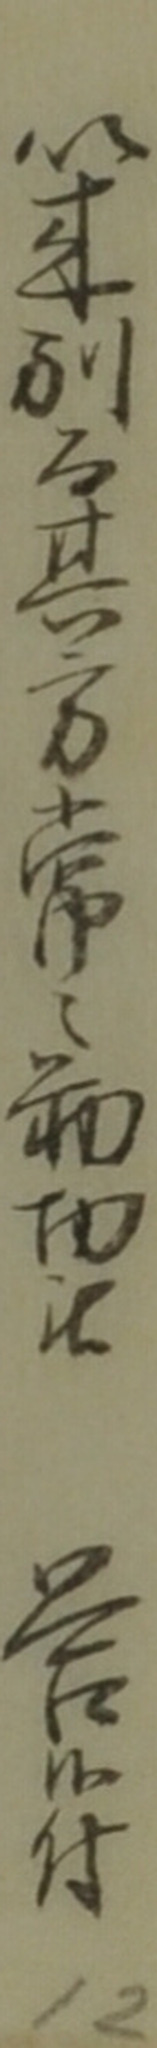以来別而其方常々勤功被思召候付
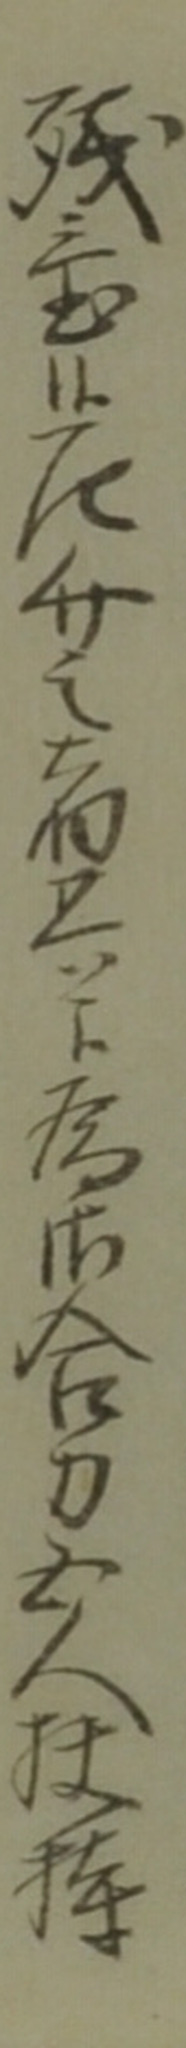残置候厄介之者共江為御合力五人扶持
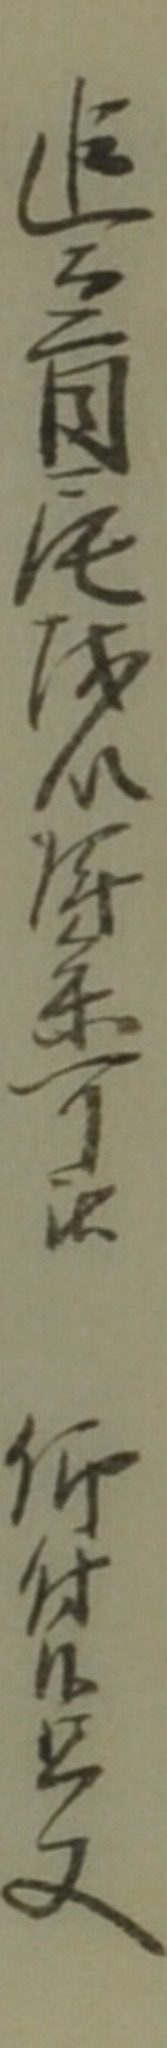追而首尾を以帰参可被仰付候且又
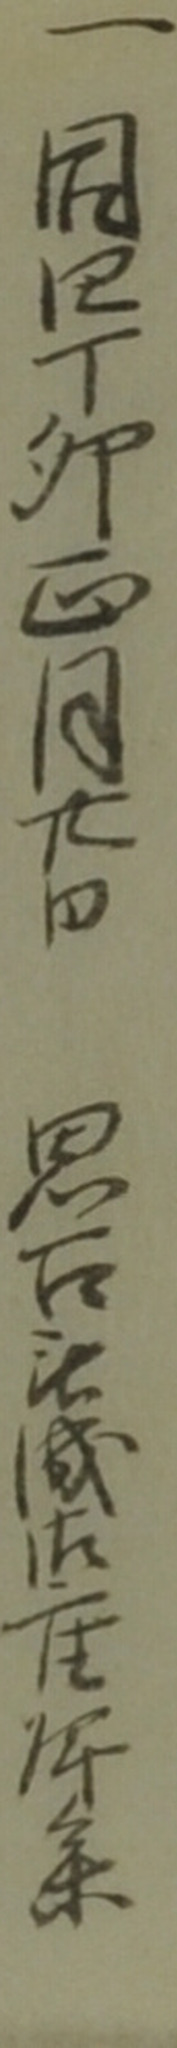一同四丁卯正月廿日思召被成御座帰参
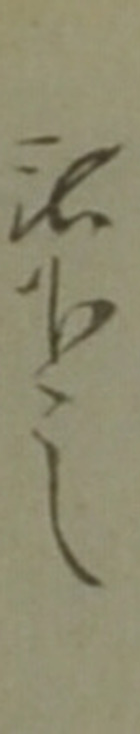被下之
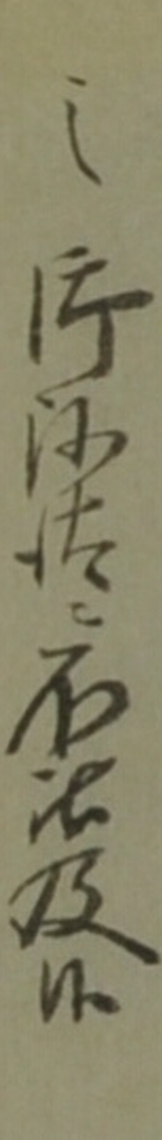之御沙汰ニ不被及候
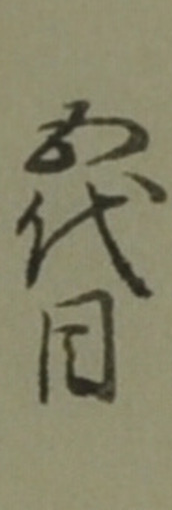五代目
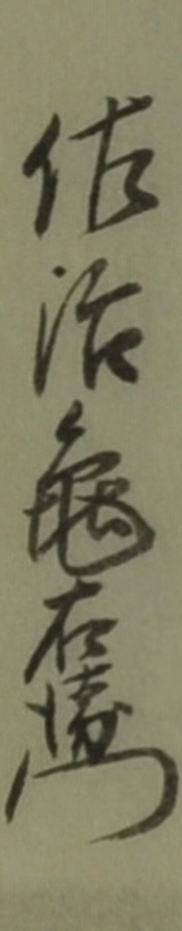佐治亀右衛門
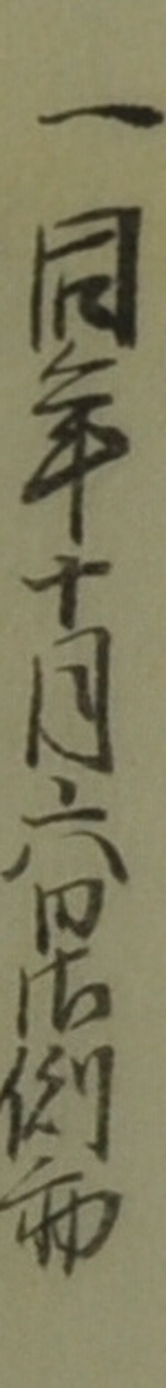一同年十月六日御側勤
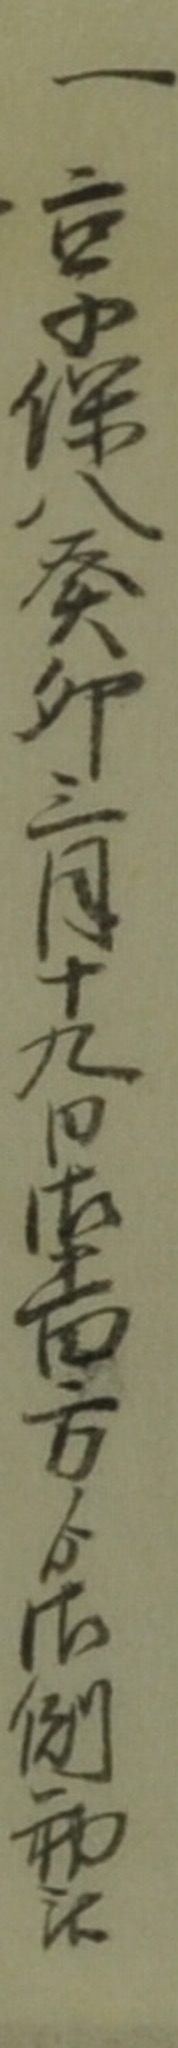一享保八癸卯三月十九日御番方ゟ御側勤被
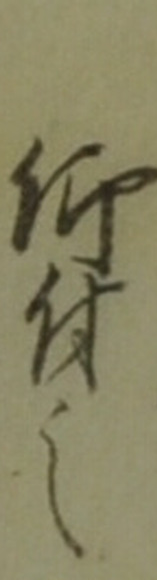仰付之
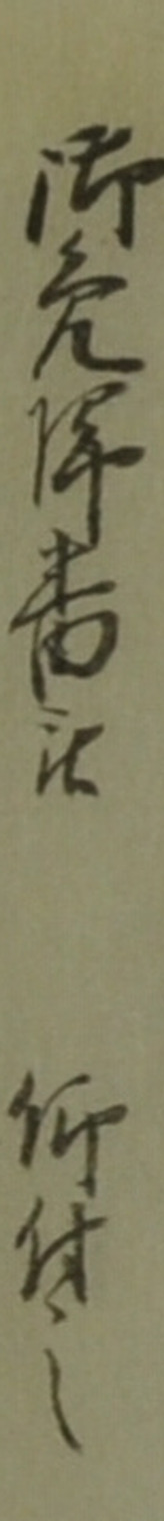御免帰番被仰付之
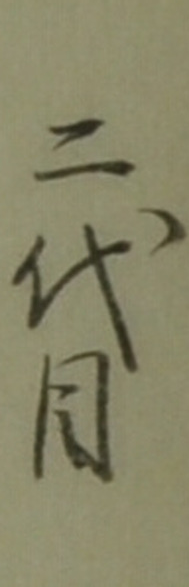二代目
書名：諸御役代々録（五）
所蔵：伊那市立高遠町図書館・合同会社AMANE
